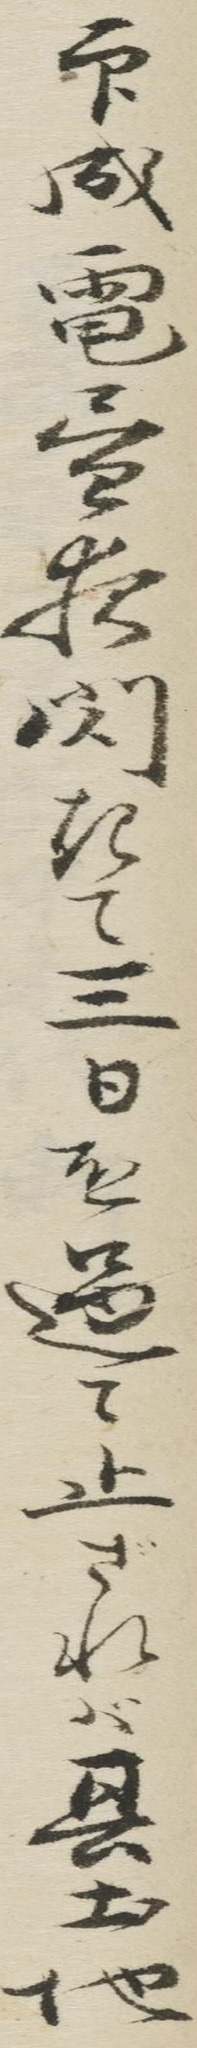印成電昼夜閃きて三日を過て止ざれバ其土地
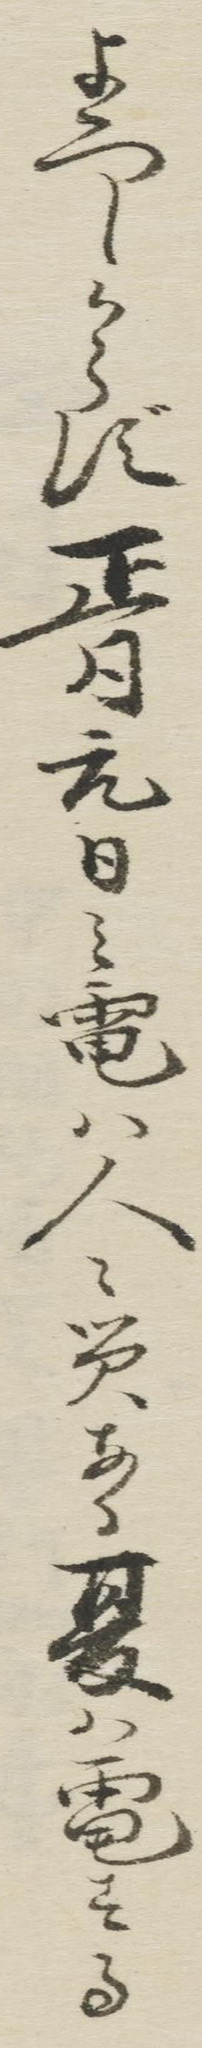よろしからず正月元日之電ハ人々災あり夏ハ電する
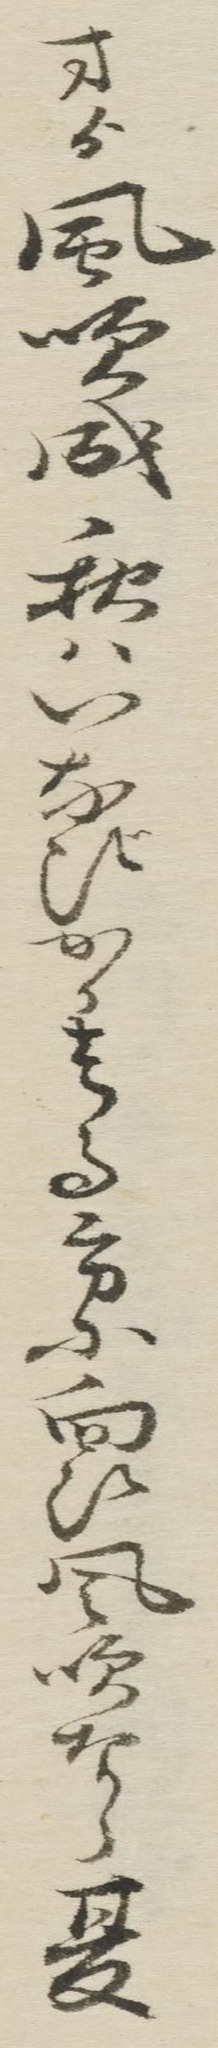方ゟ風吹成秋ハいなびかりする方に向ひ風吹なり夏
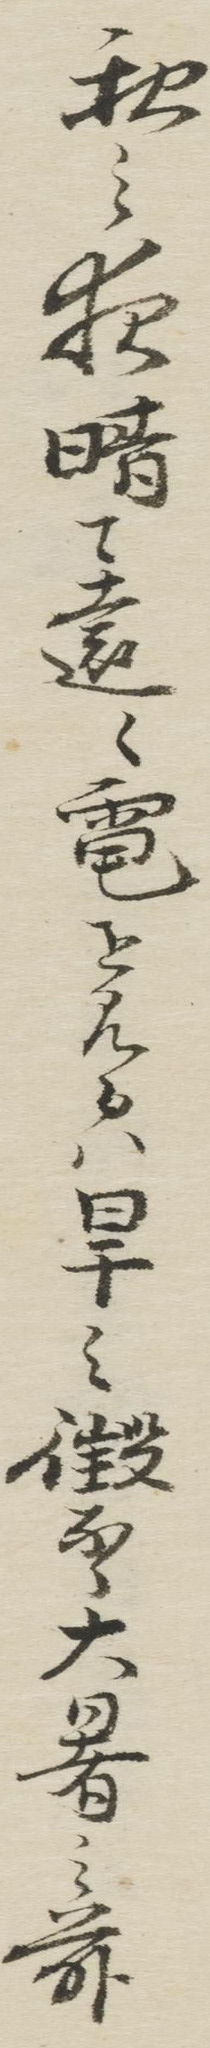秋之夜晴て遠く電を見るハ旱之徴なり大暑之前
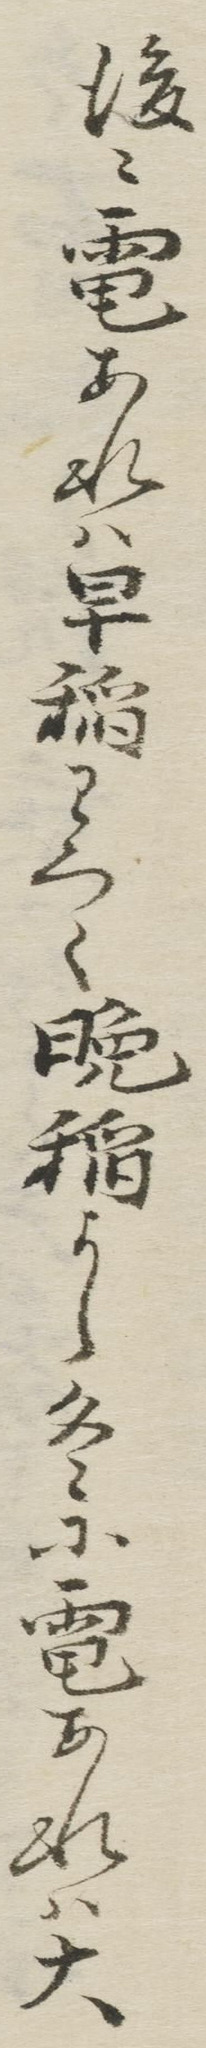後ニ電あれハ早稲わろく晩稲よし冬に電あれハ大
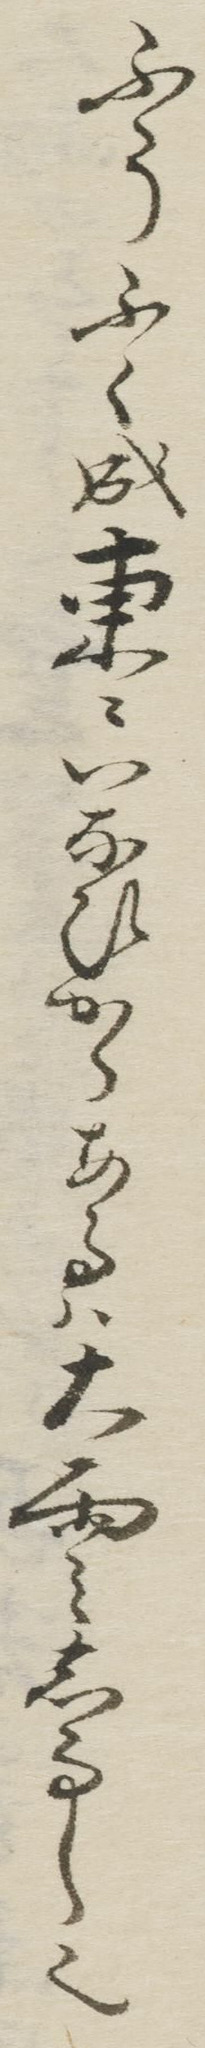ふうふく成東ニいなひかりあるハ大雨之しるし也
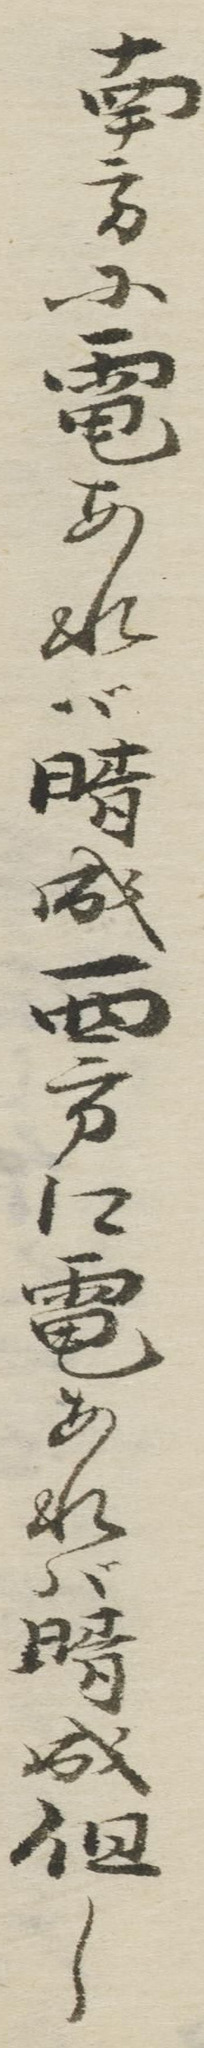南方に電あれバ晴成西方に電あれバ晴成但し

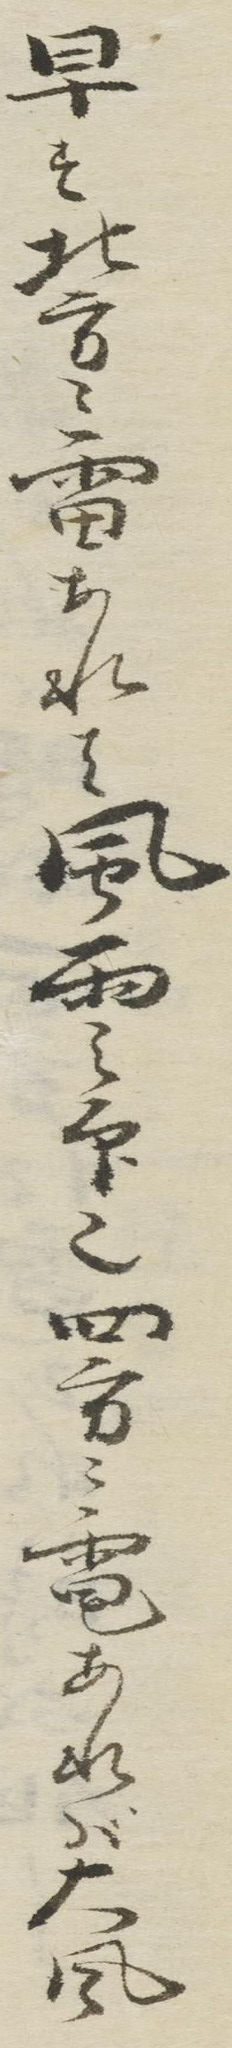早す北方ニ雷あれば風雨之印也四方ニ電あれバ大風
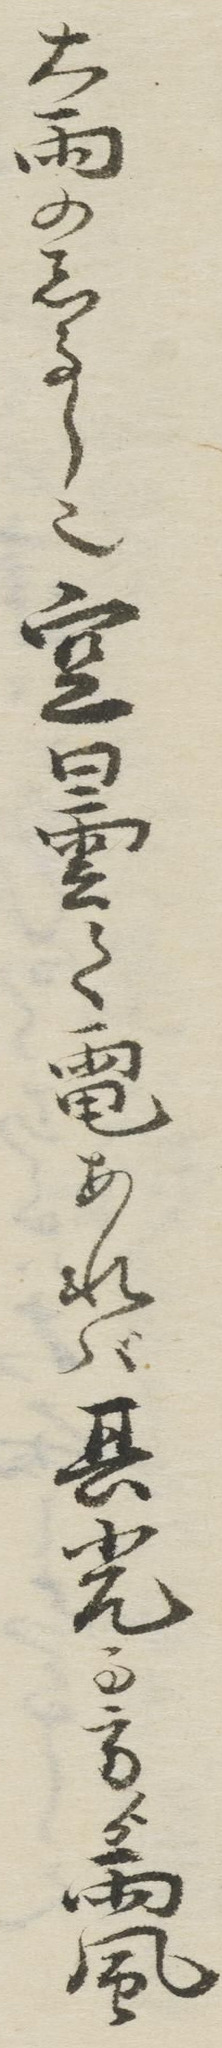大雨のしるし也空雲て電あれバ其光る方ゟ雨風
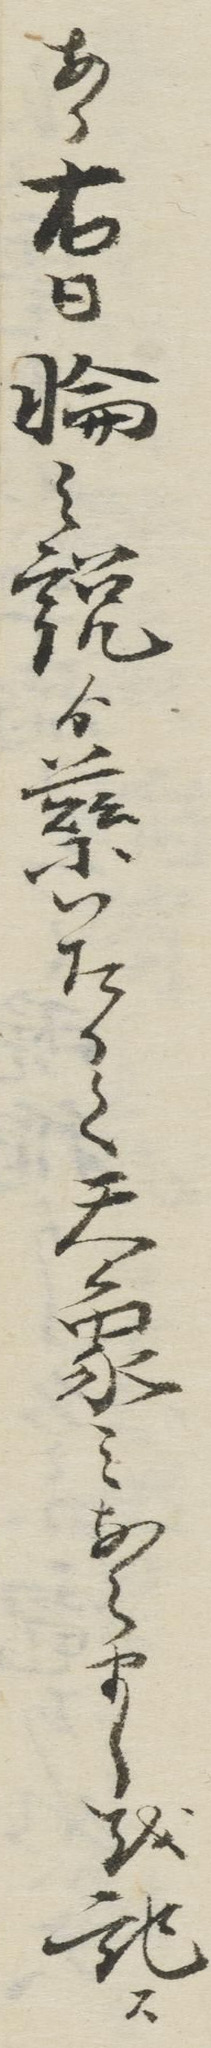あり右日輪之説ゟ茲にいたりて天象之あらすじを記ス
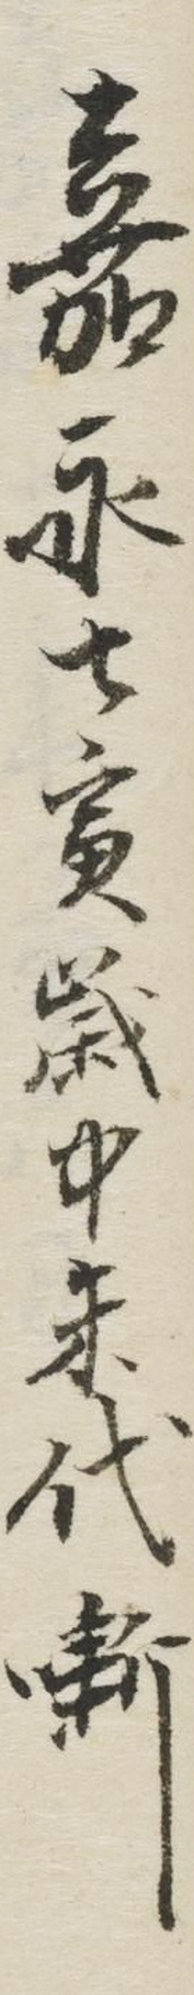嘉永七寅歳中末代噺
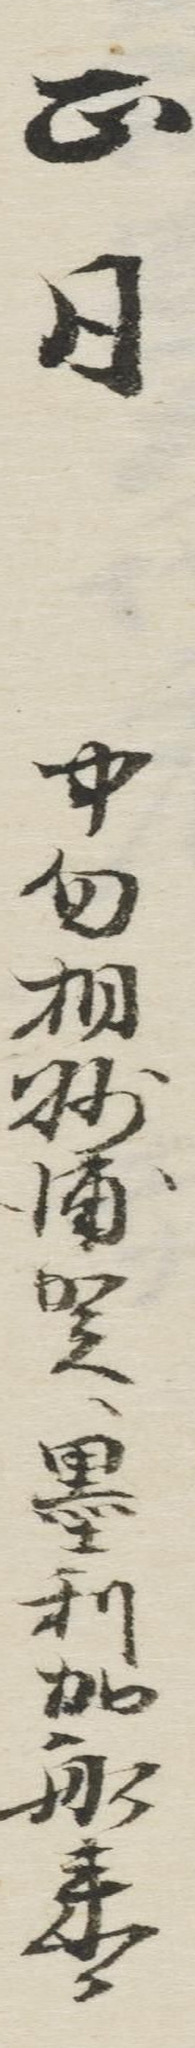正月中旬相州浦賀へ墨利加船来る
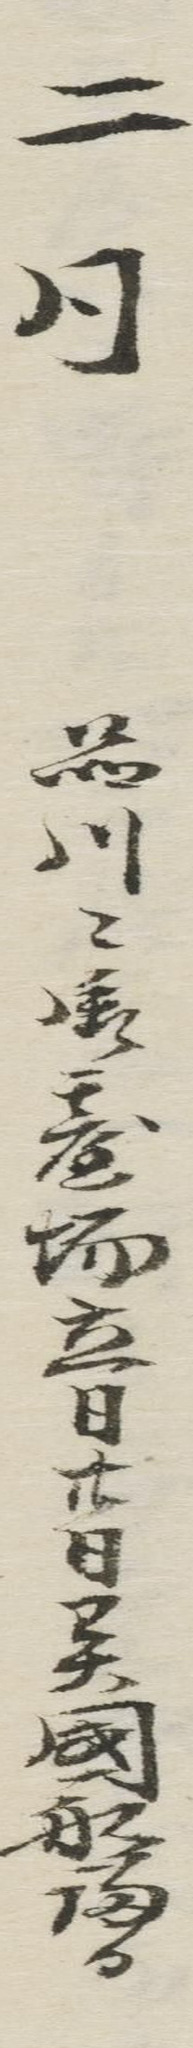二月品川ニ御台場立日廿日異国船帰る
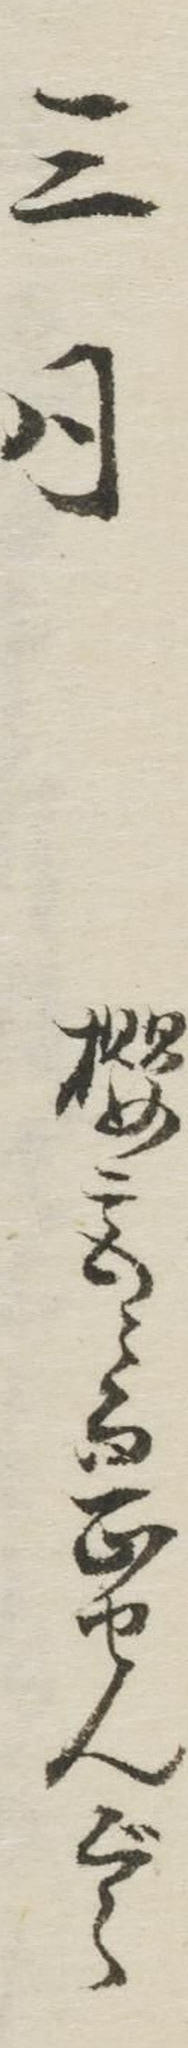三月桜宮ニ而正セんぐ
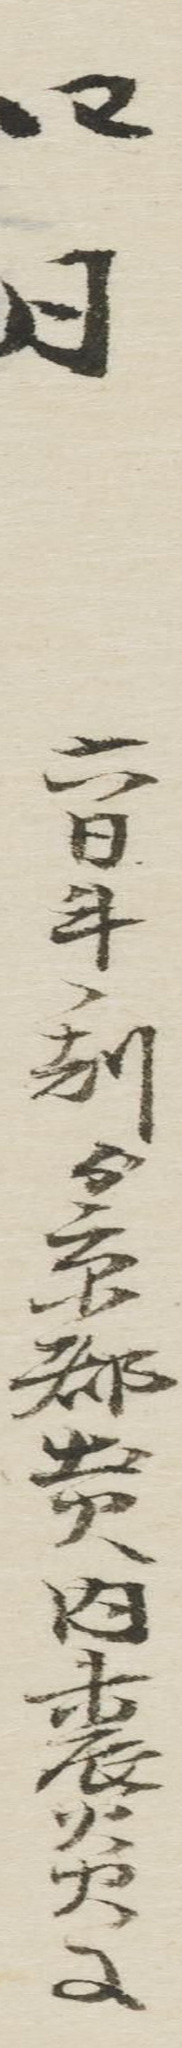四月六日牛ノ刻ゟ京都出火内裏炎る
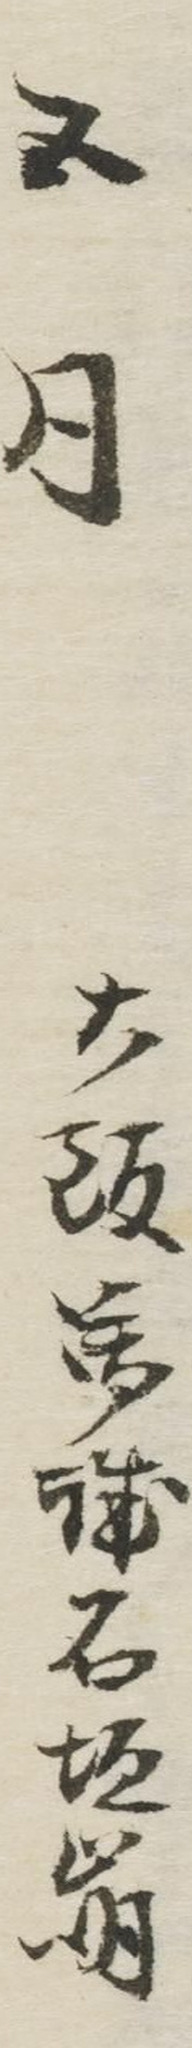五月大坂御城石垣崩
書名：諸国大地震大津波一代記
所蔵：東京大学地震研究所図書室 Earthquake Research Institute Library, The University of Tokyo, JAPAN
